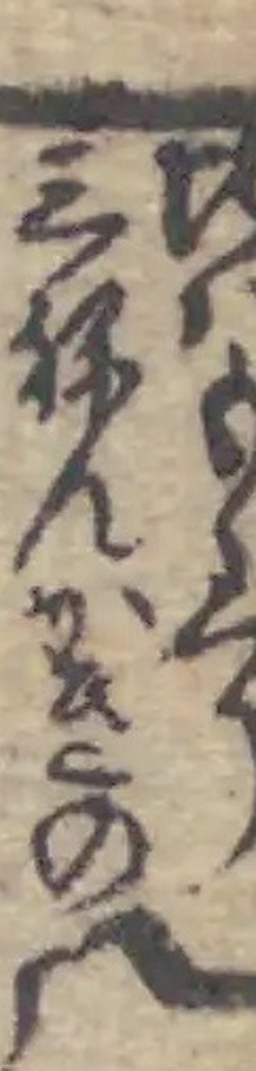三ねんかきの
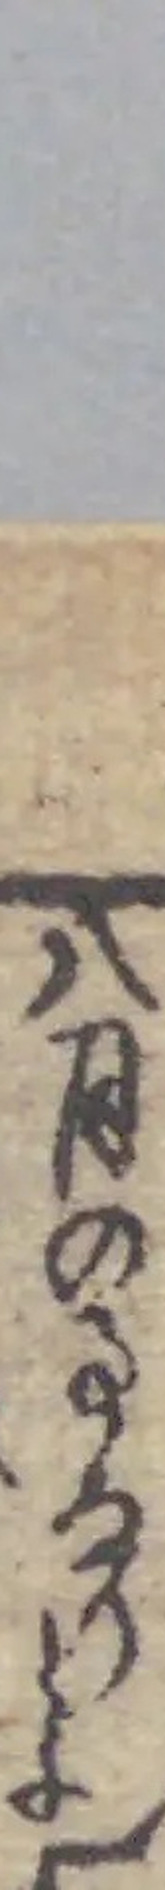八月の事なりとよ
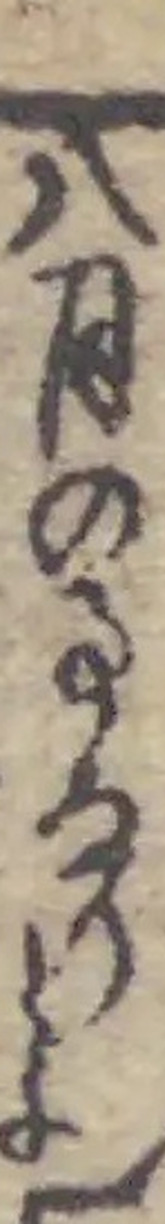八月の事なりとよ
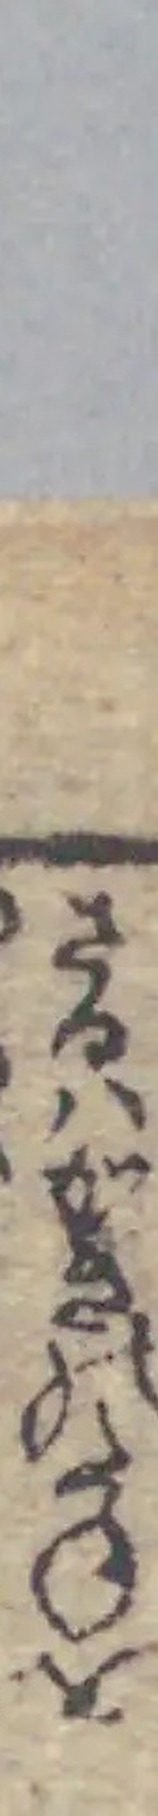さるはかきのたねを
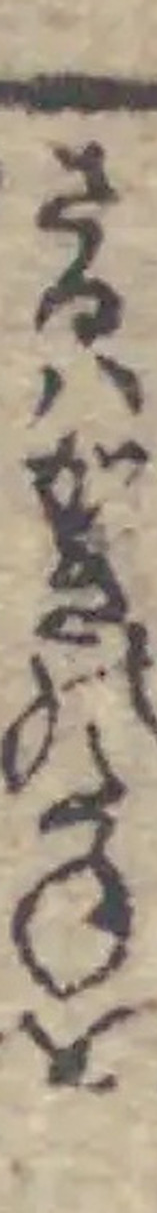さるはかきのたねを
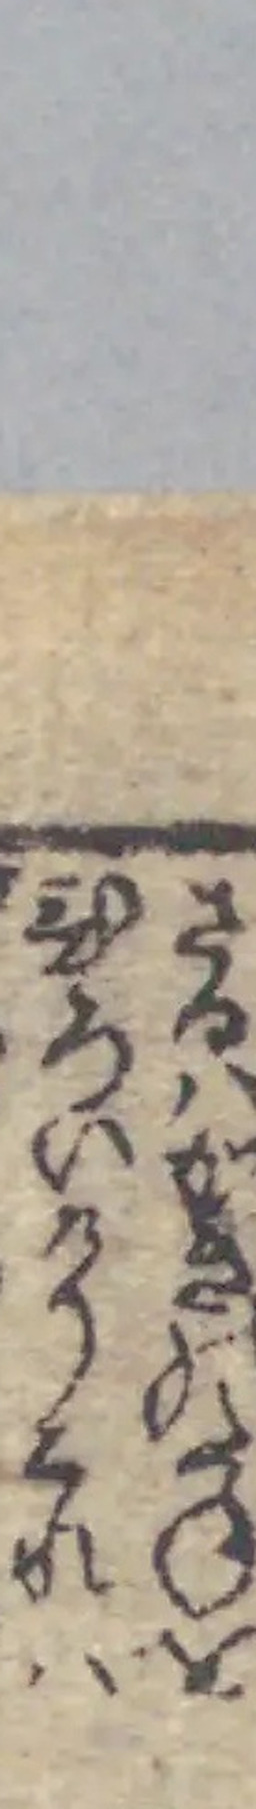ひろいけりこれは
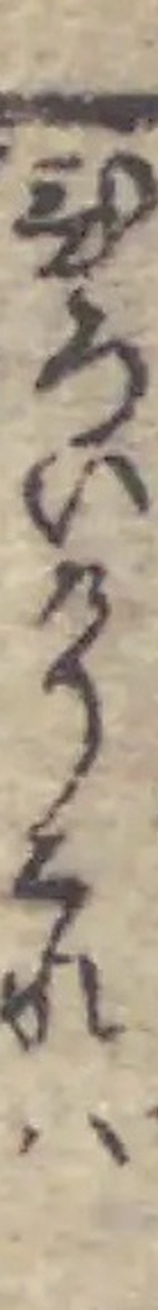ひろいけりこれは
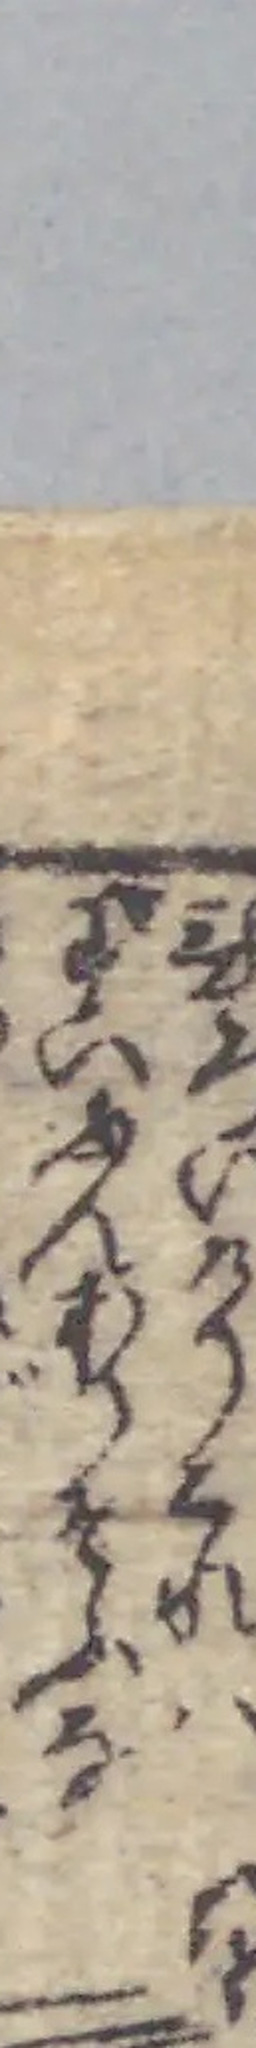ずいぶんありそふな
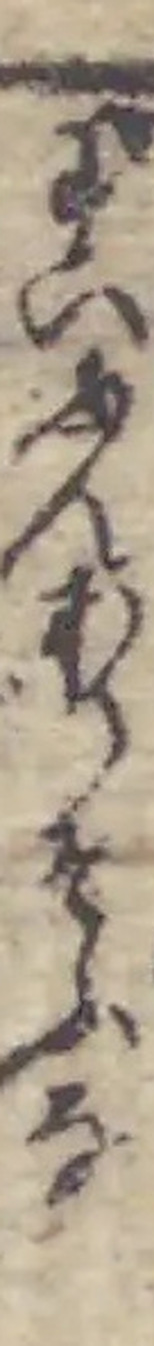ずいぶんありそふな
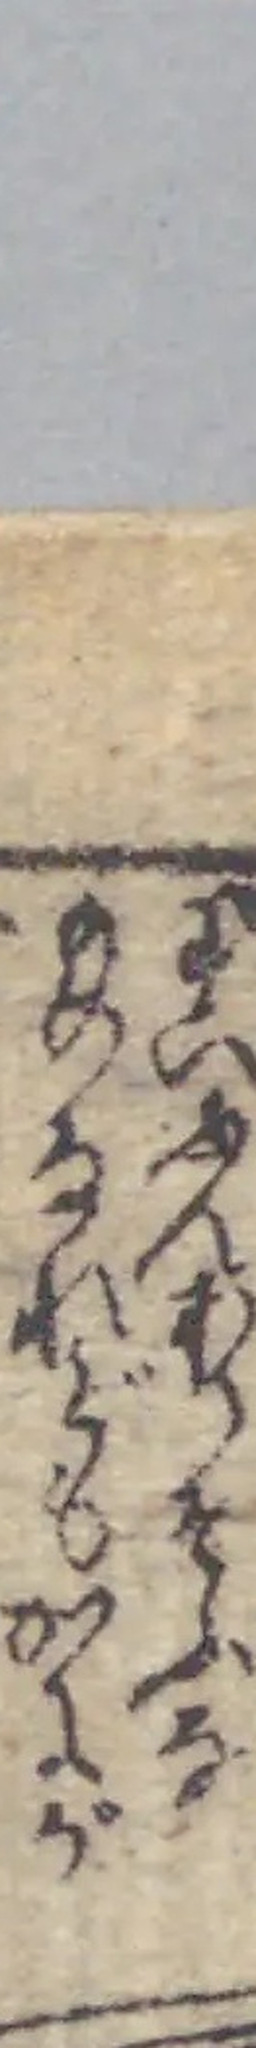ものなれどもかにが
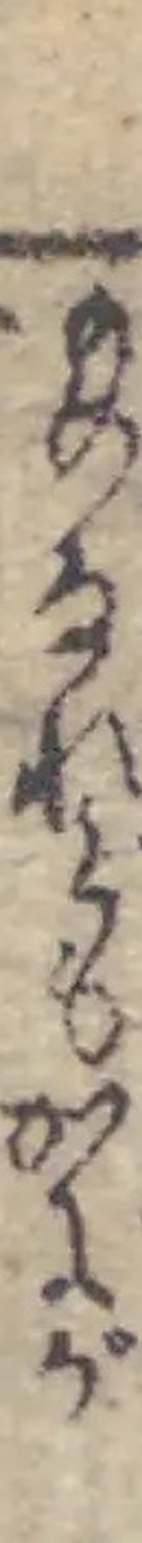ものなれどもかにが
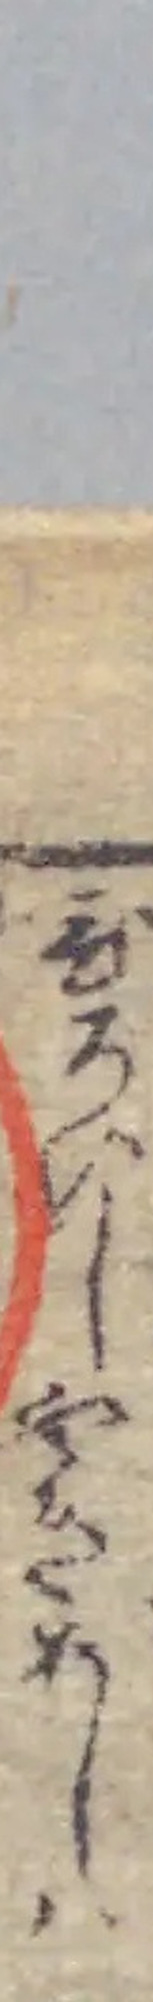ひろいしやきめしは
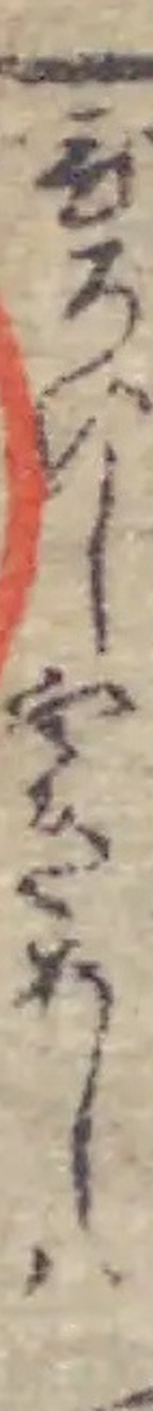ひろいしやきめしは
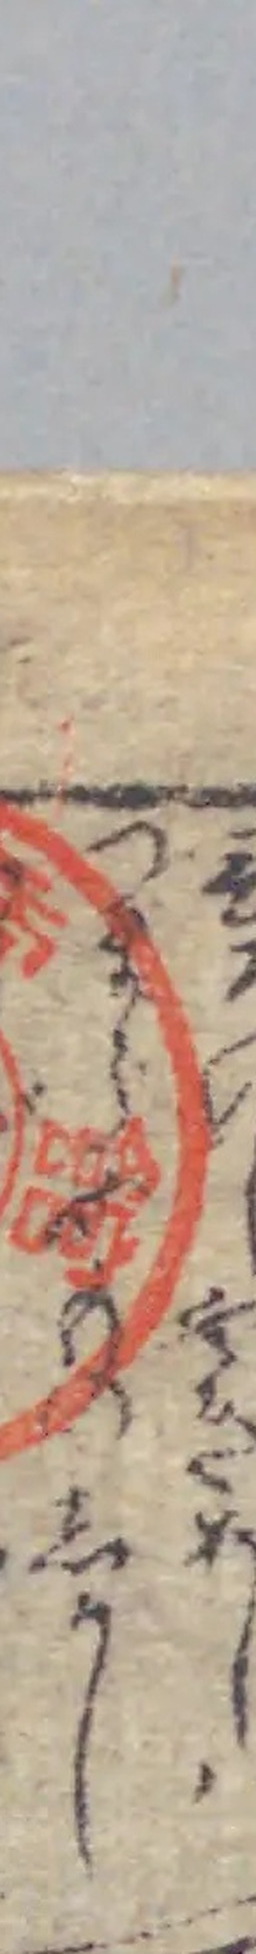つまらぬものしかし
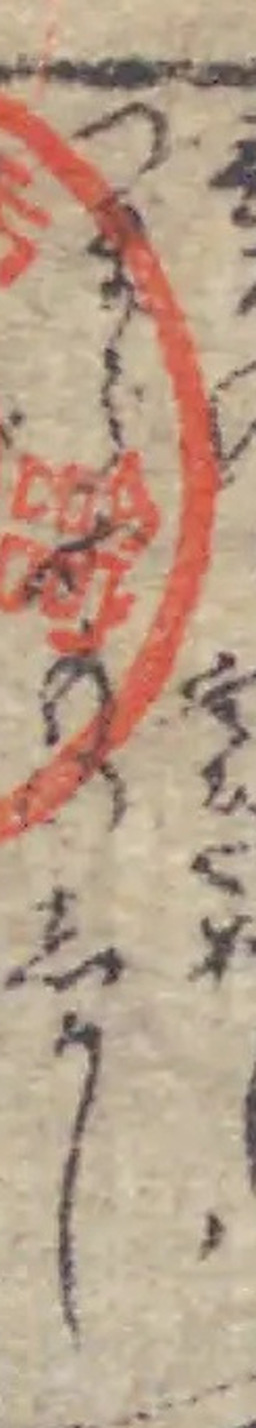つまらぬものしかし
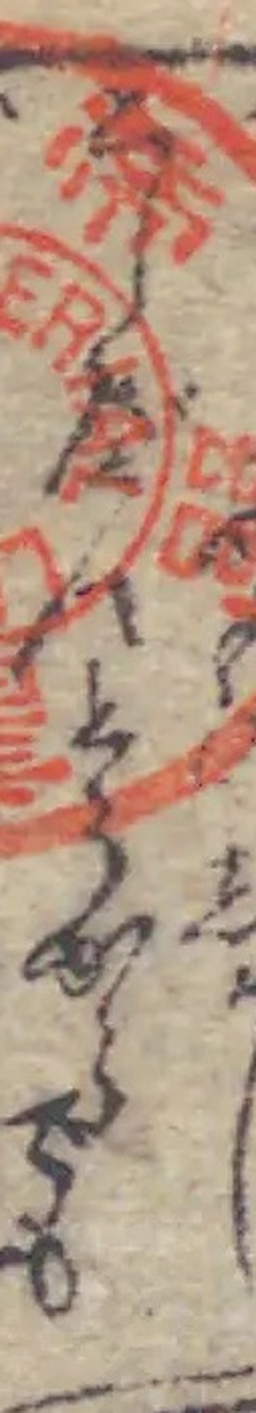こしべんとうからでも
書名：蟹牛房挟多 3巻
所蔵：国立国会図書館 National Diet Library, JAPAN
